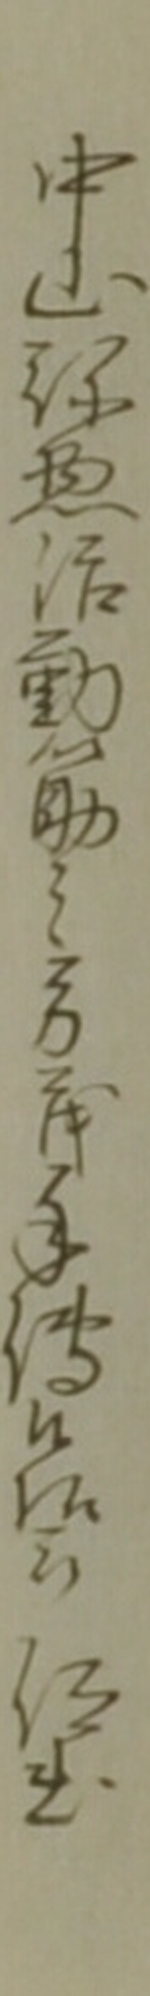中山弥惣治勤筋之方茂手伝候様被仰出
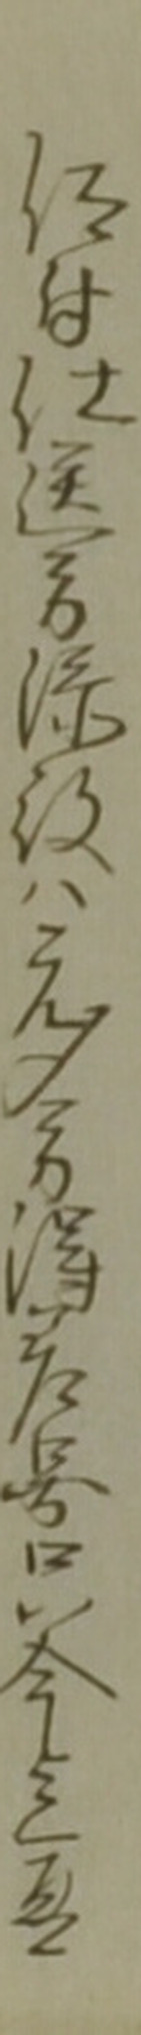仰付仕送方添役は元〆方得差図只今迄通
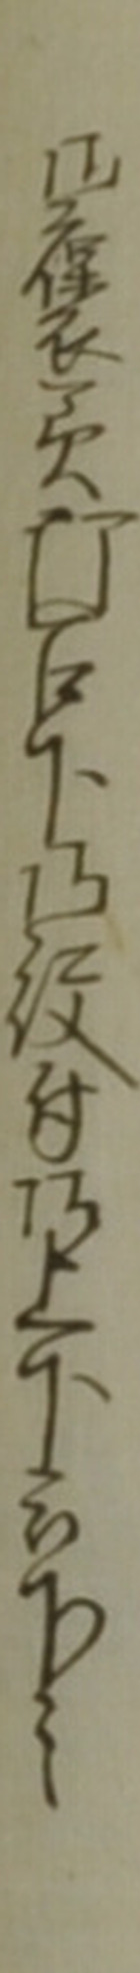御褒美御召下御紋付御上下被下之
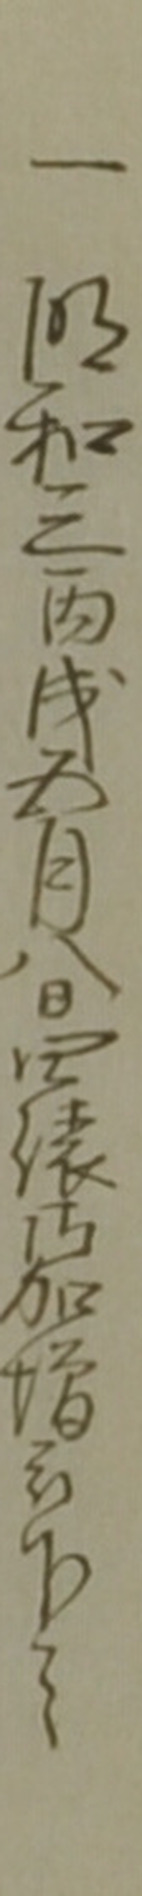一明和三丙戌五月八日四俵御加増被下之
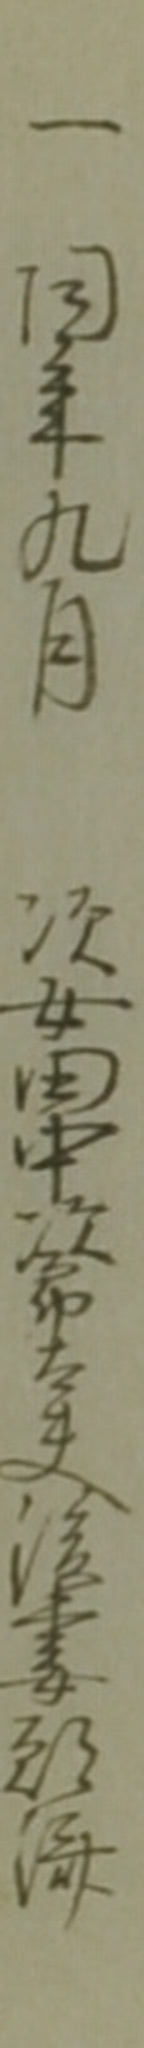一同年九月次女田中次郎太夫後妻願済
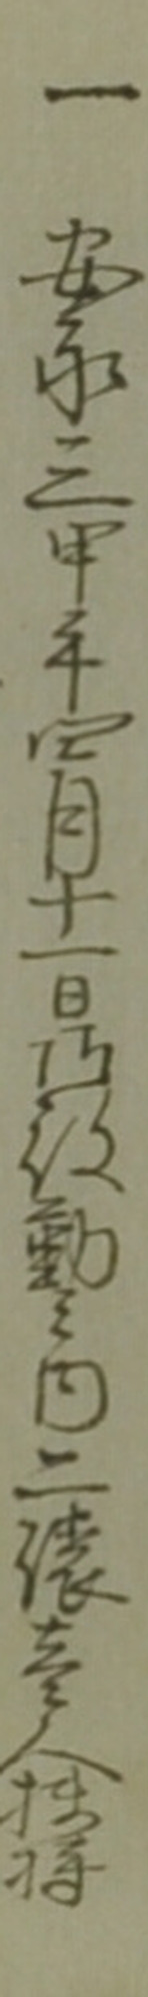一安永三甲午四月十一日御役勤之内二俵壱人扶持
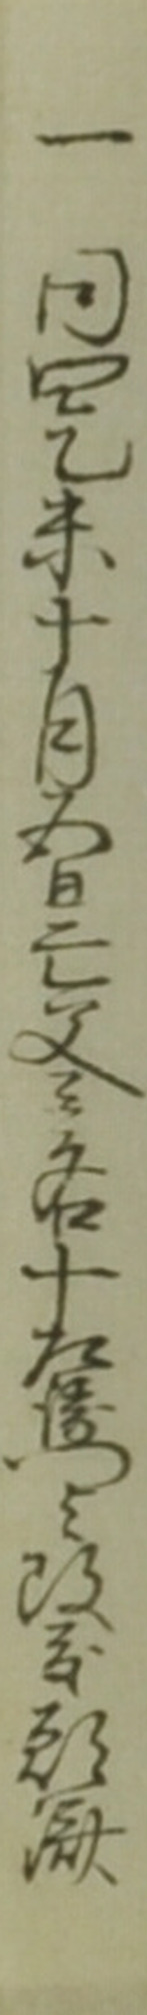一同四乙未十月五日亡父之名十左衛門と改度願済
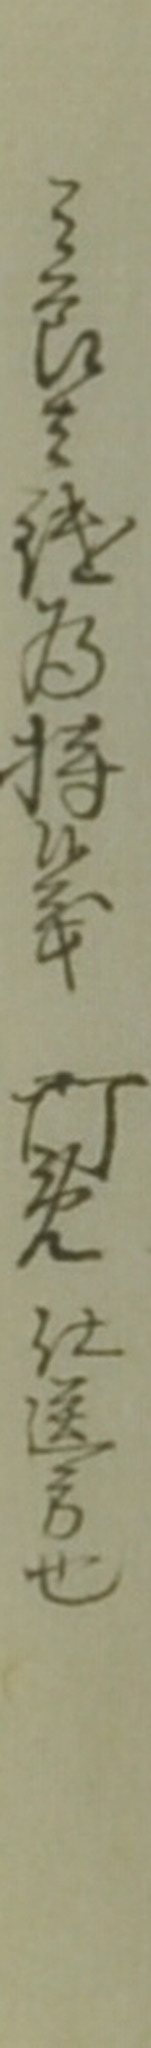之節者鑓為持候義御免仕送方也
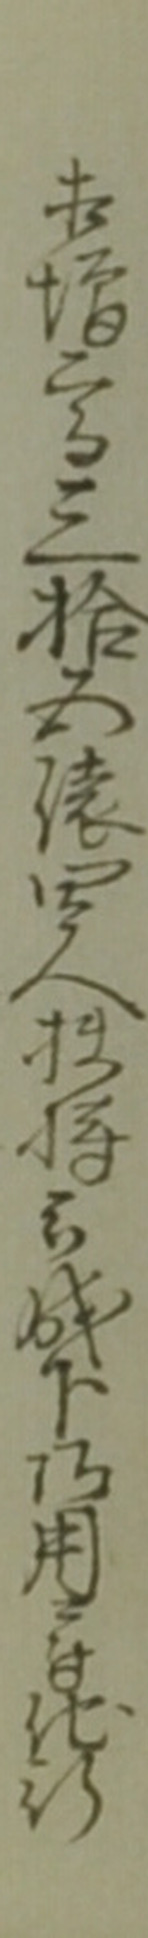相増高三拾五俵四人扶持被成下御用に付他行

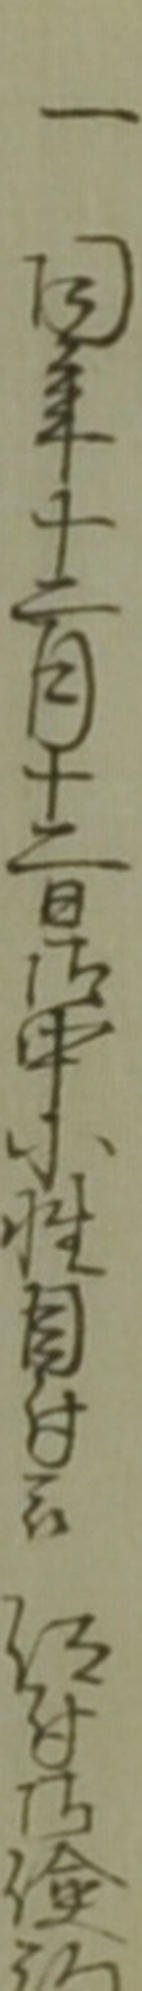一同年十二月十二日御中小性目付被仰付御倹約
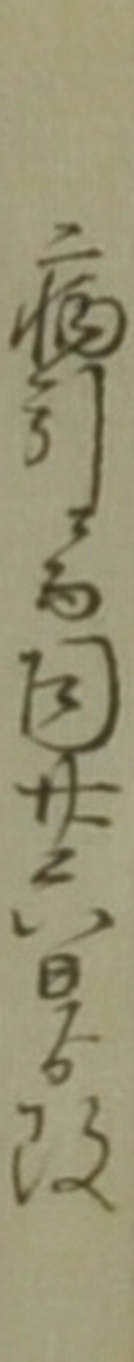病引に而同廿六日ゟ改
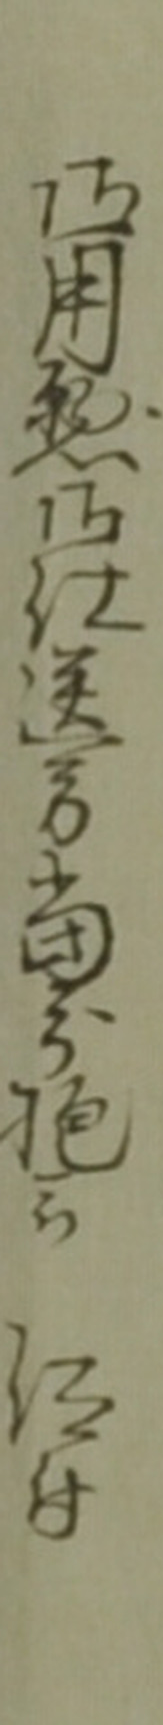御用懸御仕送方当分抱被仰付
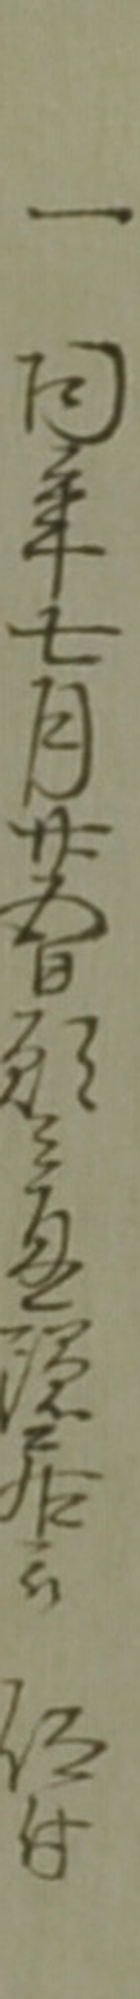一同年七月廿五日願之通隠居被仰付
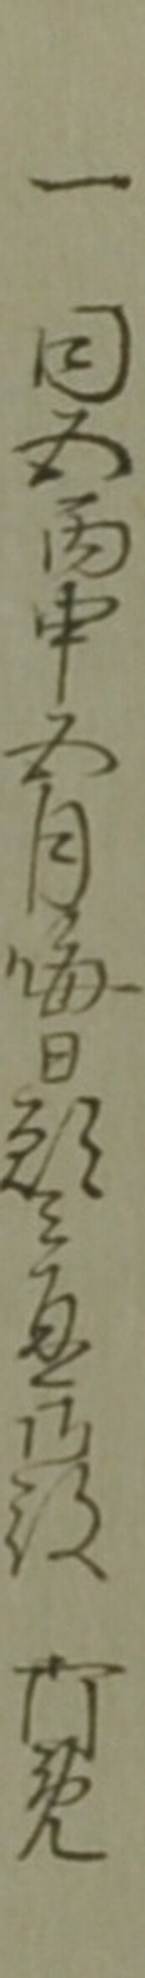一同五丙申五月晦日願之通御役御免
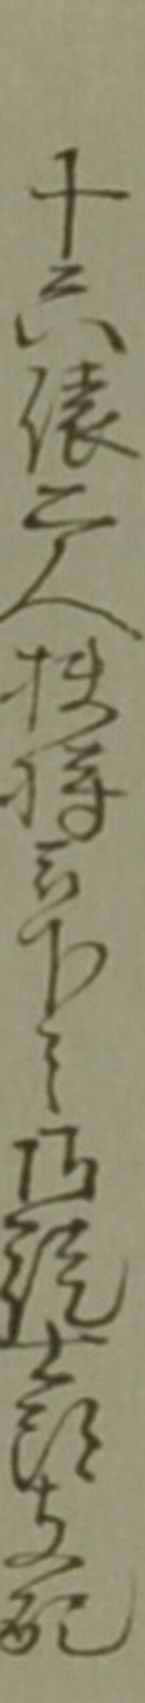十六俵二人扶持被下之御徒士頭支配
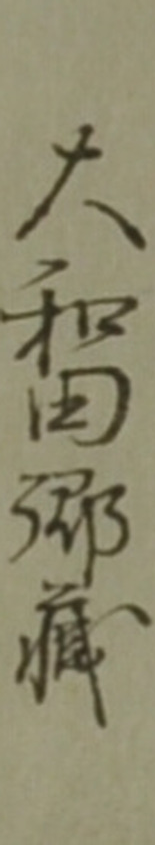大和田郷蔵
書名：無足諸士勤仕録（三）
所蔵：伊那市立高遠町図書館・合同会社AMANE
